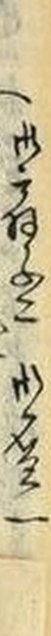御扇子二御盃一
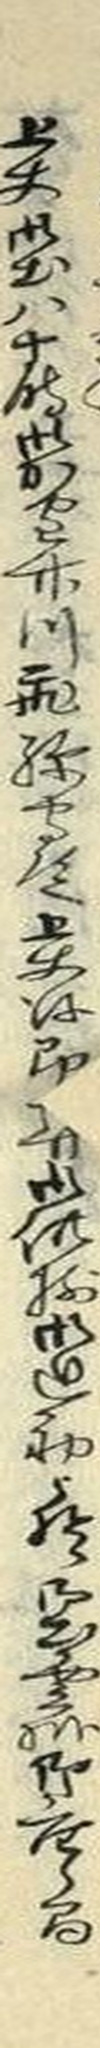上使御出八半時御加宜竹川飛騨守殿上使後即刻御供揃御廻勤被遊候御出殿掛御座之間
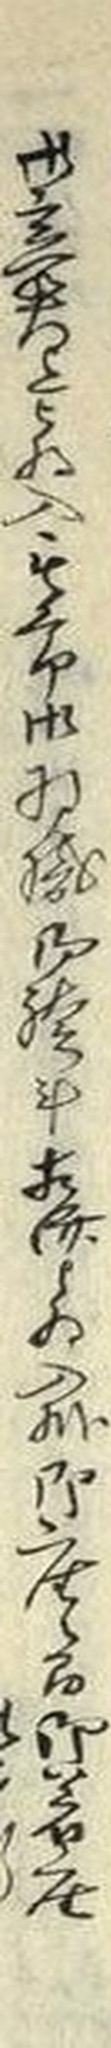御玄関迄被為入其節御羽織御袴斗相済被為入掛御座之間御着座
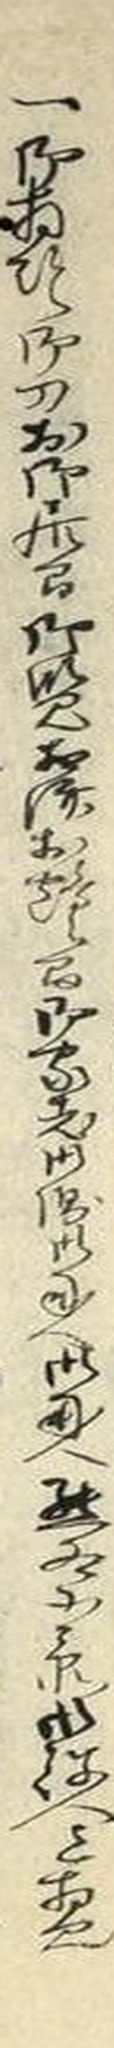一御拝領之御刀於御居間御覧相済於鶴之間御家老御側御用人御用人熊谷小兵衛御役人迄拝見
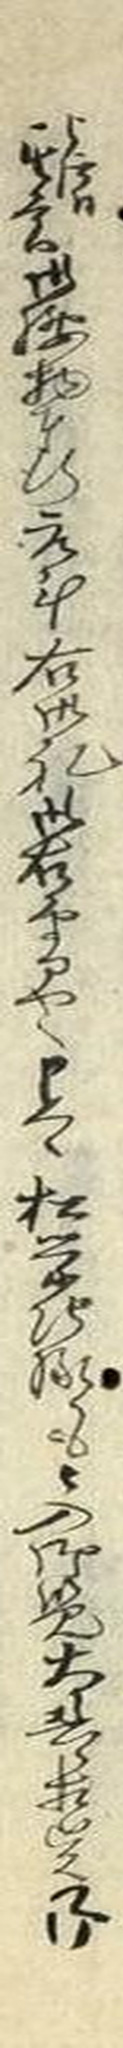被仰付其節御腰物奉行取計右御礼御右筆部屋へ申上候松栄院様へも被入御覧大奥へ相廻ス御
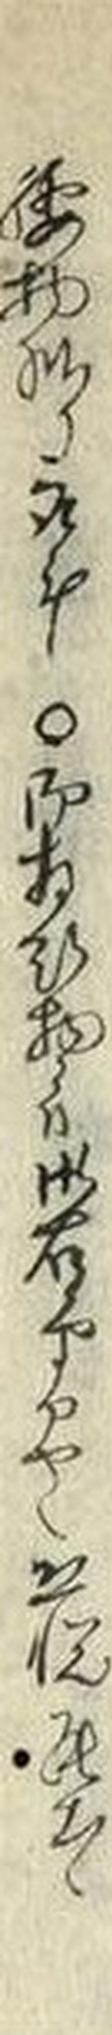腰物掛り取計〇御拝領物ニ付御右筆部屋へ恐悦罷出候

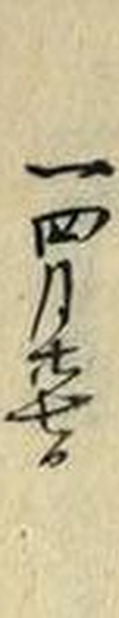一四月廿八日
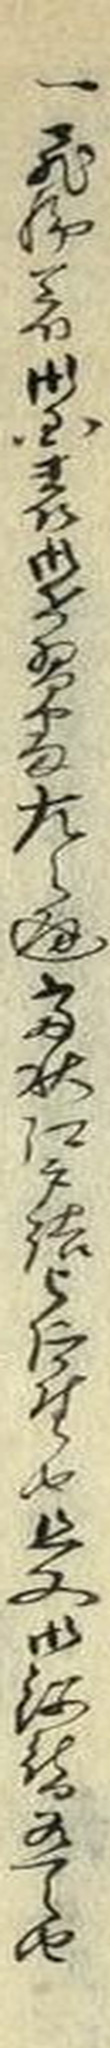一飛脚着御国表御近習番左之通当秋江戸詰被仰付候由且又御役替有之由
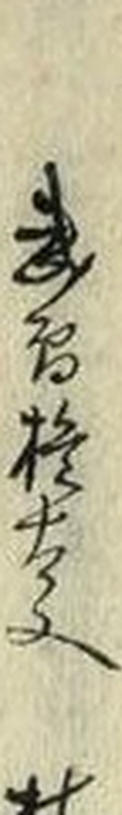武曽権太夫
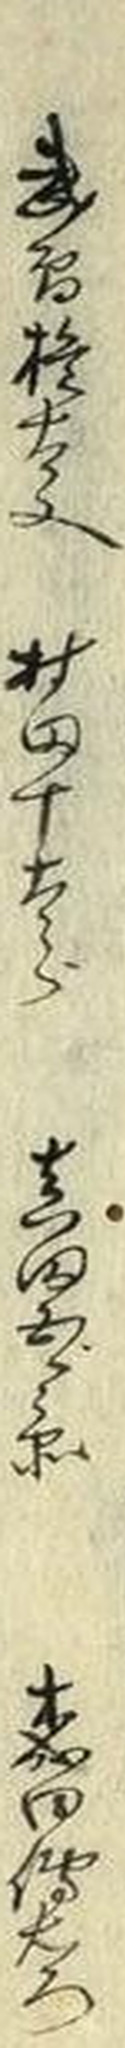武曾権太夫村田十太郎真田五郎兵衛森田伝右衛門
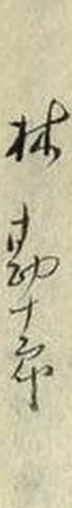林勘十郎
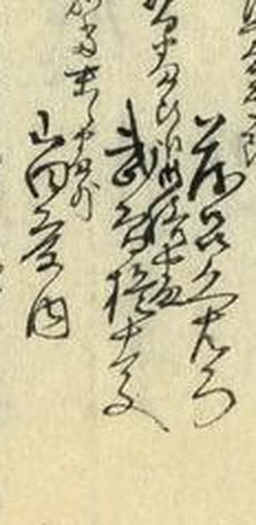武曽権太夫
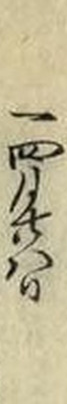一四月廿八日
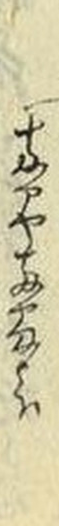両部屋両番被下
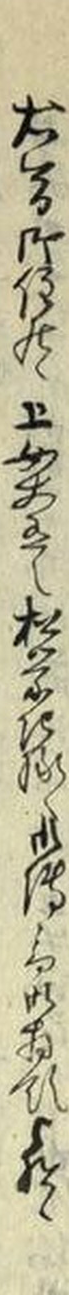右今日御住居へ上女使有之松栄院様へ御伝ニ而御拝領被遊候
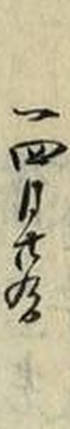一四月廿八日
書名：少傅日録抄（斉善付側向頭取日記、在府）
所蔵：福井県文書館 Fukui Prefectural Archives
